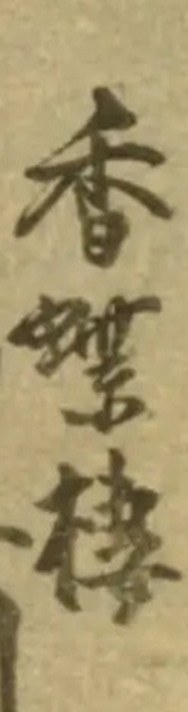香蝶樓
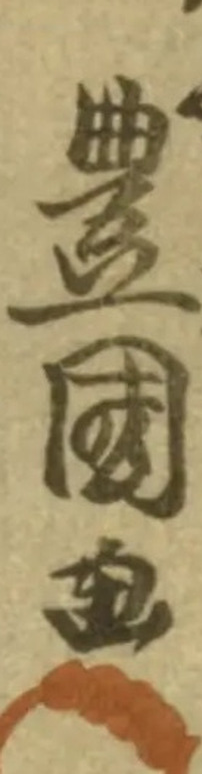豊國画
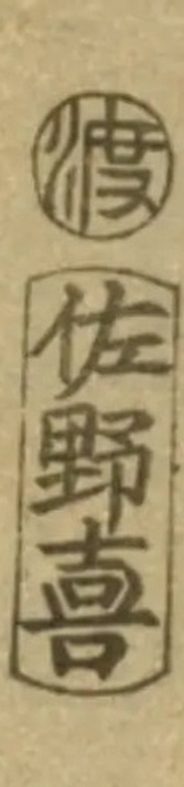渡佐野喜
